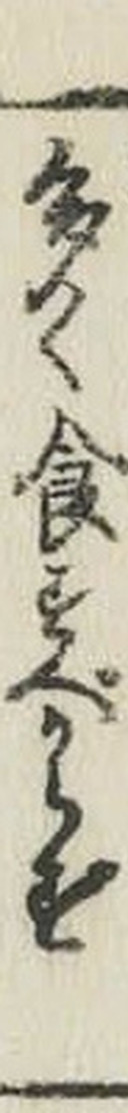多く食すべからず
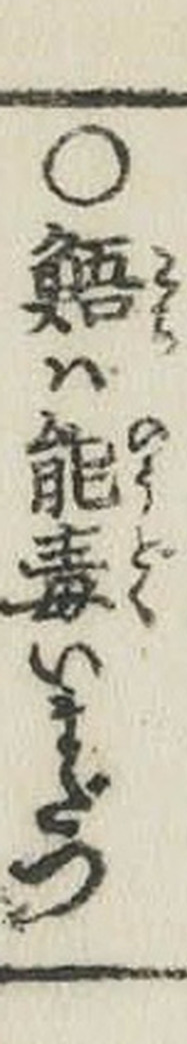○鯃は能毒いまだつ
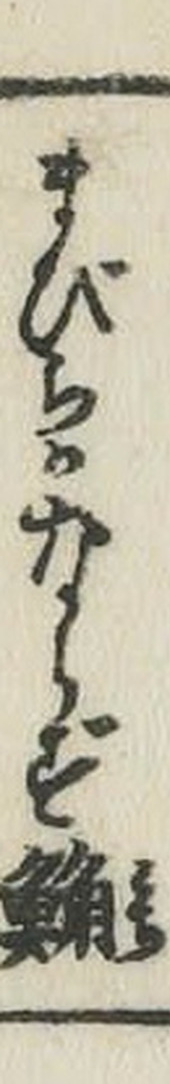まびらかならず鯒
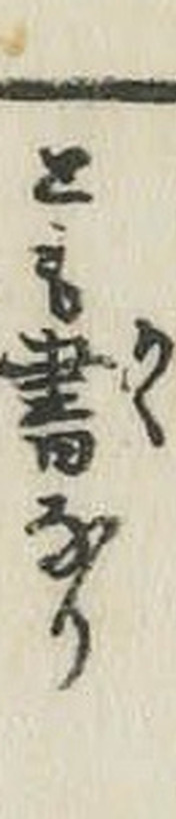とも書なり
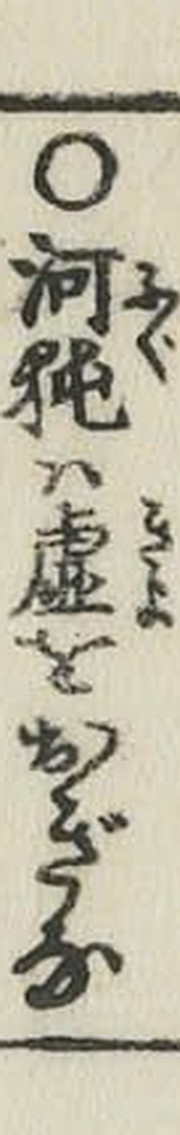○河㹠は虚をおぎな
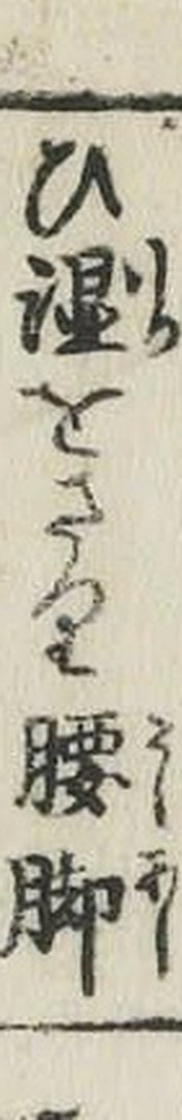ひ湿をさり腰脚
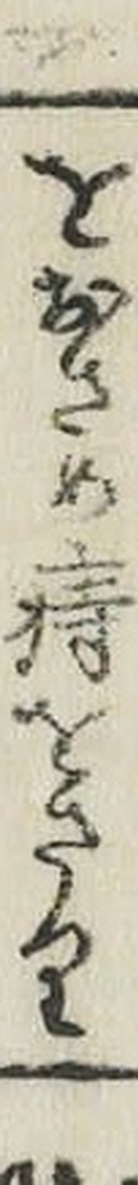をおさめ痔をさり
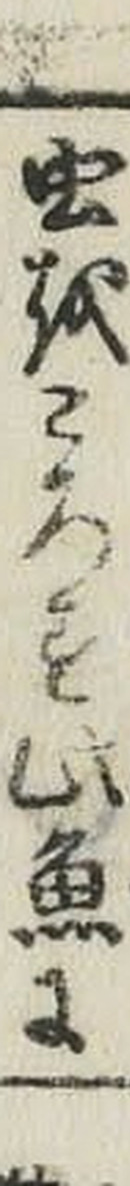虫をころす此魚に
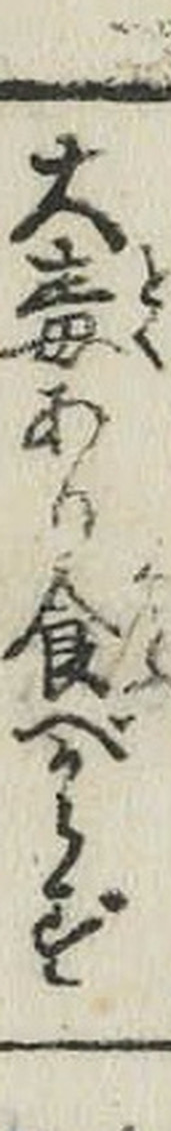大毒あり食べからず
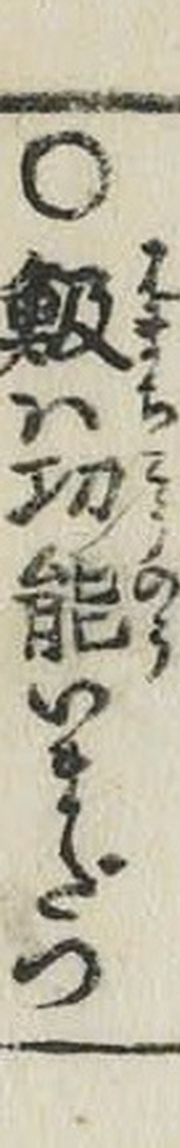○魥は効能いまだつ
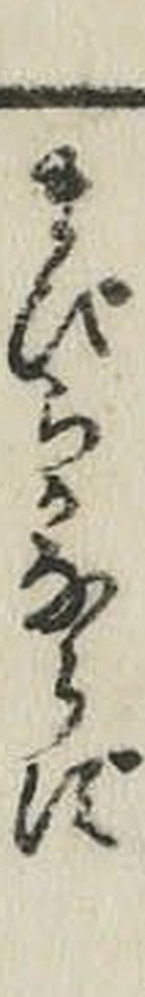まびらかならず

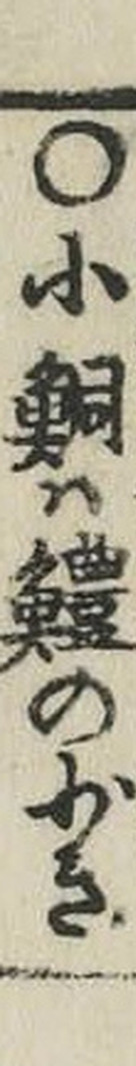○小鮦は鱧の少き
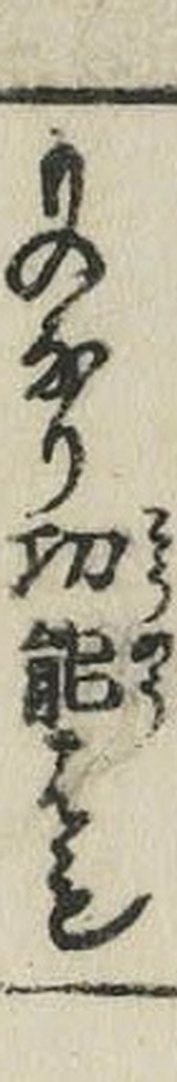ものなり功能はも
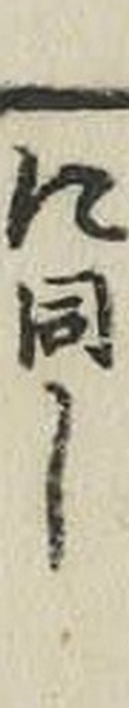に同し
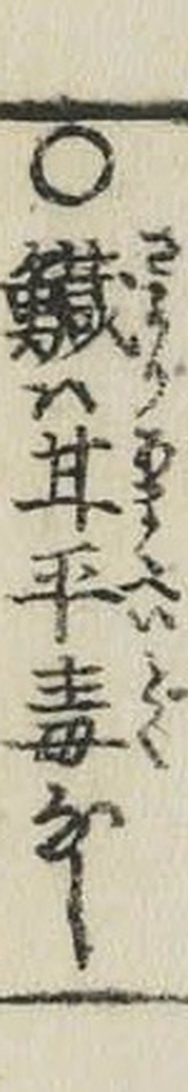○鱵は甘平毒なし
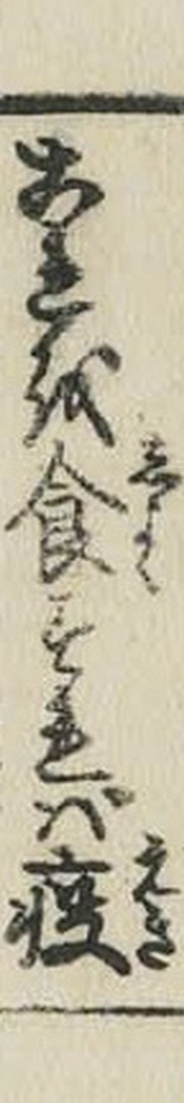これを食すれば疫
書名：増補頭書訓蒙図彙大成 10巻 7:巻之14-16
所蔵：東京学芸大学教育コンテンツアーカイブ
